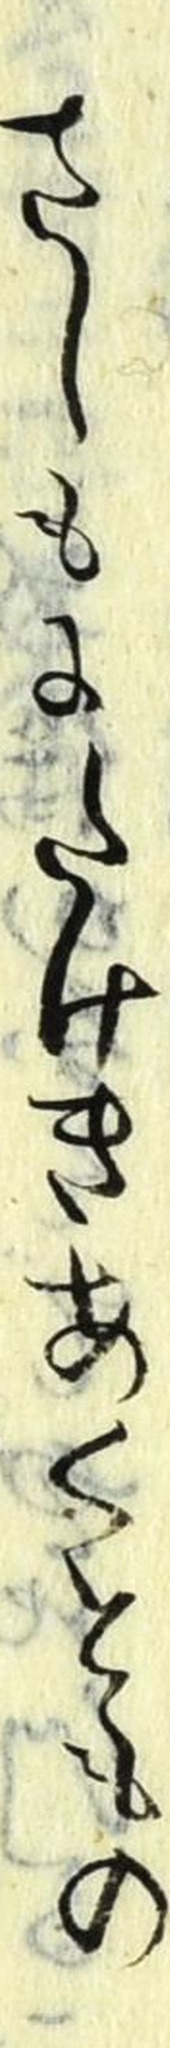さしもにたけきあくともの
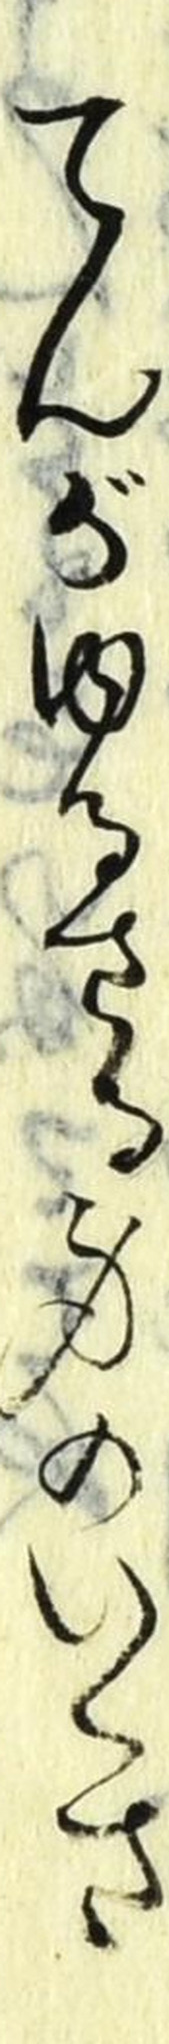てんがゆるさる身のいくさ
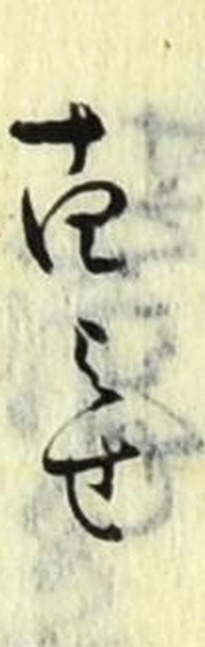十四とせ
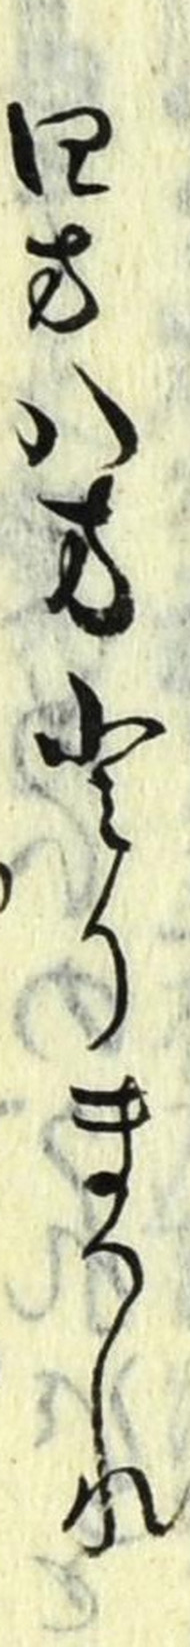四方八方とりまかれ
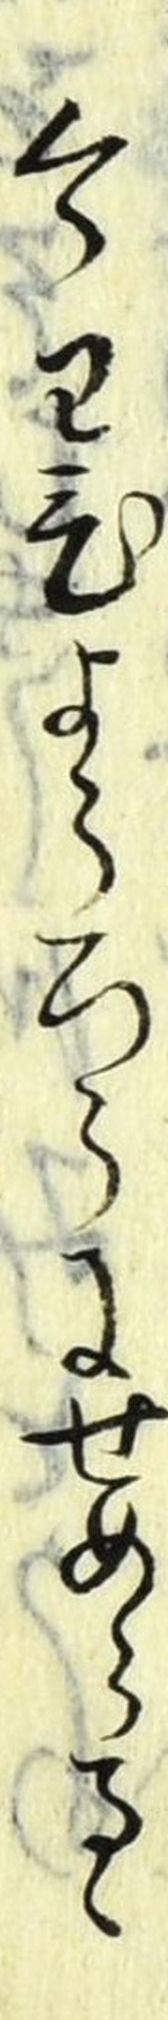今わひようろうにせめらるゝ

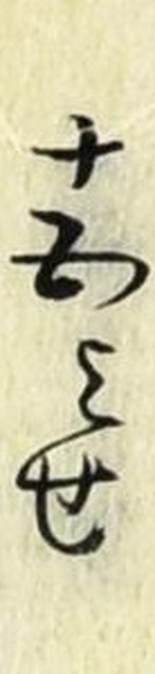十五とせ
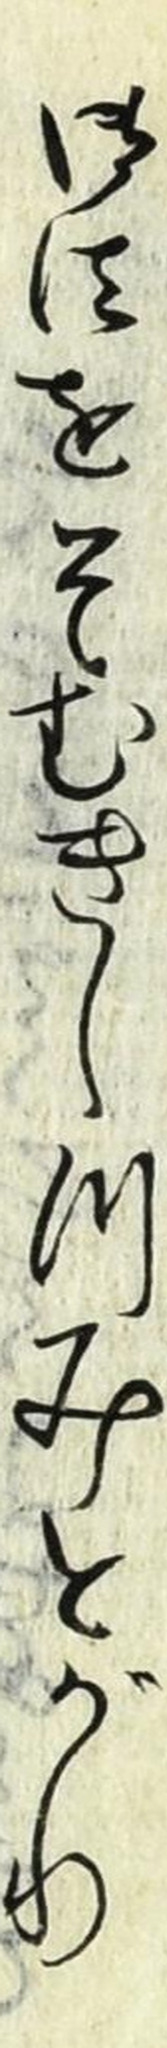御法をそむきしつみとがわ
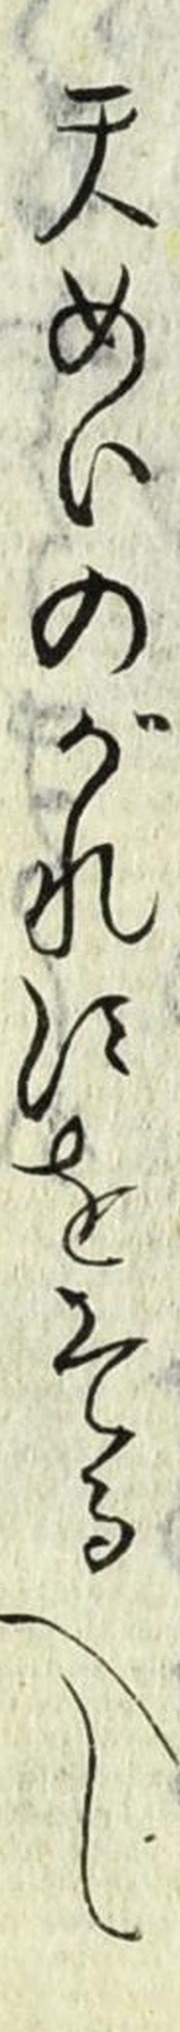天めいのがれすをそるへし
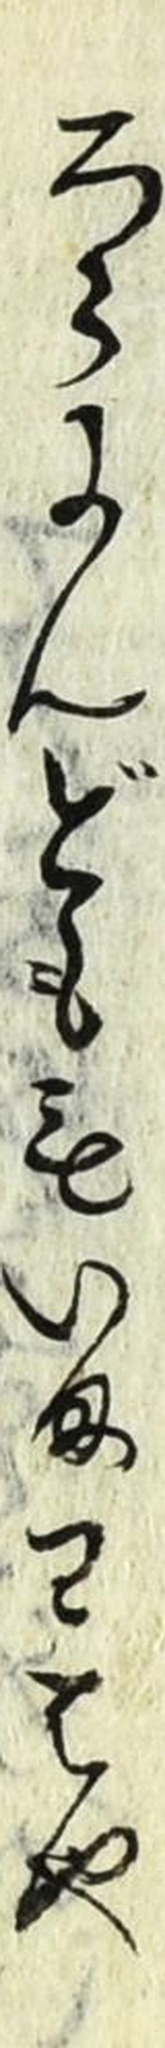ろうにんどももいまわはや
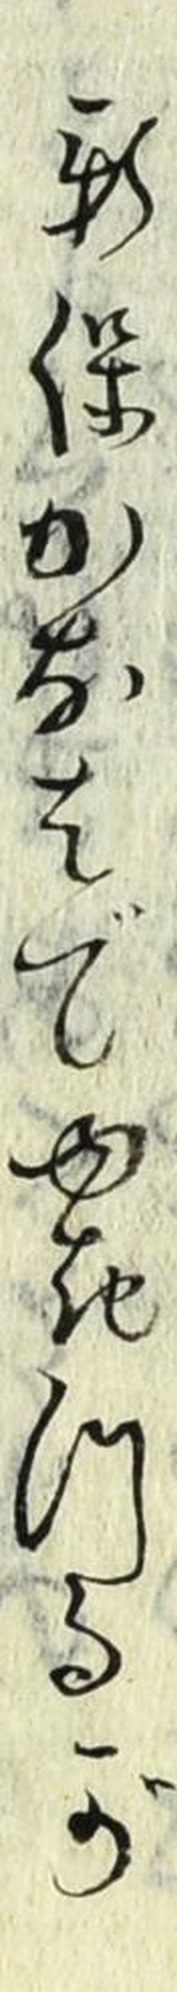新保かなはでゆきつるが
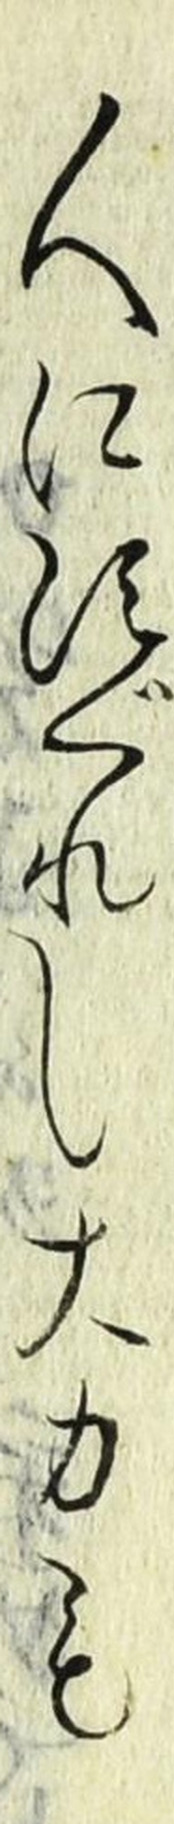人にすぐれし大力も
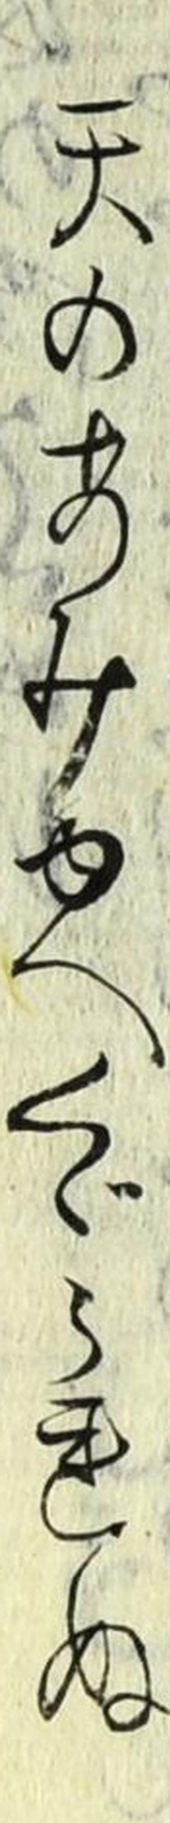天のあみゆへくゞられぬ
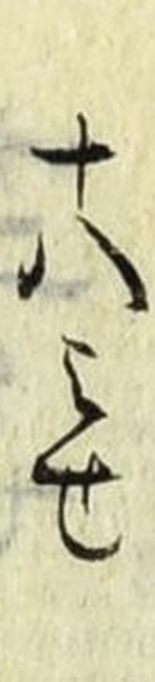十八とせ
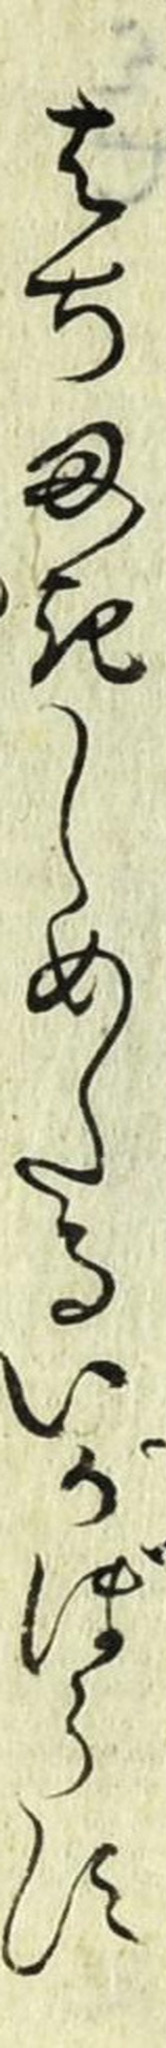はちまきしめたるいがぼうす
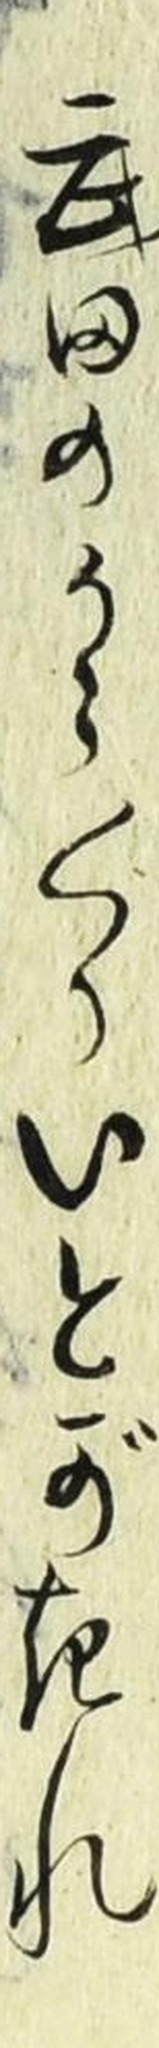武田のからくりいとがきれ
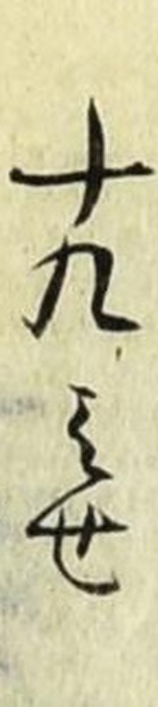十九とせ
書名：（日記）
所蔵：福井県文書館 Fukui Prefectural Archives
